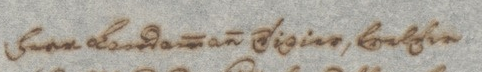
Herr Landammann Vigier, welcher
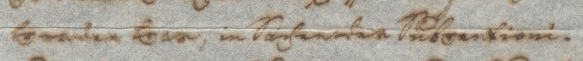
worden war, in Sachen der Subventioni-
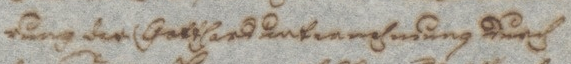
rung der Gotthardunternehmung durch
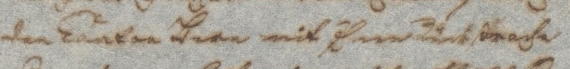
den Canton Bern mit Ihnen Rücksprache
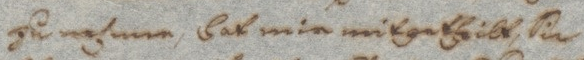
zu nehmen, hat mir mitgetheilt, Sie
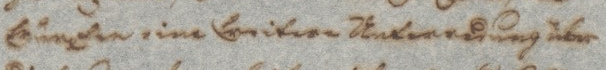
wünschen eine weitere Unterredung über
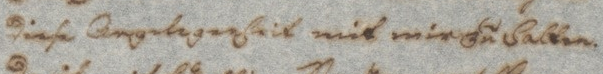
diese Angelegenheit mit mir zu halten.
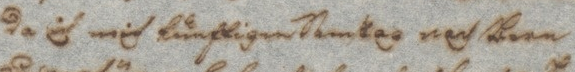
Da ich mich künftigen Samstag nach Bern
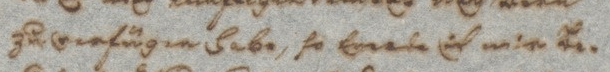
zu verfügen habe, so werde ich mir Be-
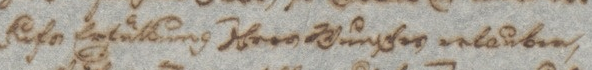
hufs Erfüllung Ihres Wunsches erlauben,
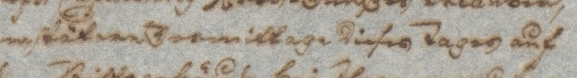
am spätern Vormittage dieses Tages auf
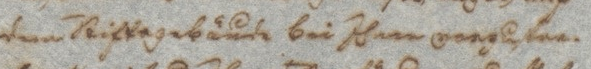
dem Stiftsgebäude bei Ihnen vorzuspre-
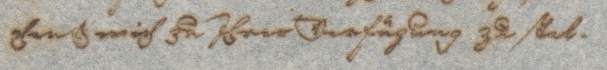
chen & mich zu Ihrer Verfügung zu stel-
